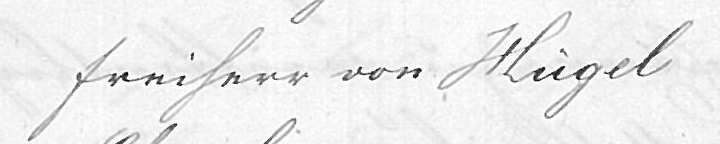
Freiherr von Hügel
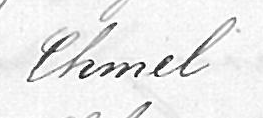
Chmel
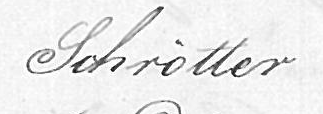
Schrötter
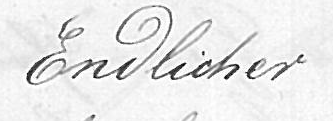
Endlicher
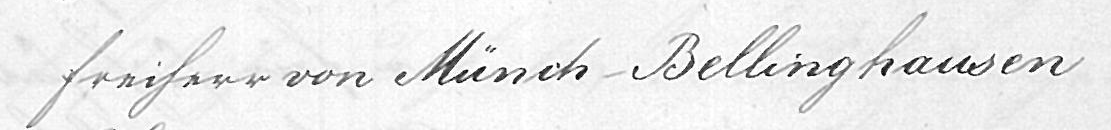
Freiherr von Münch-Bellinghausen
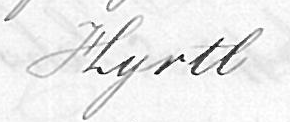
Hyrtl
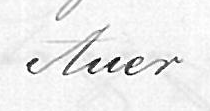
Auer
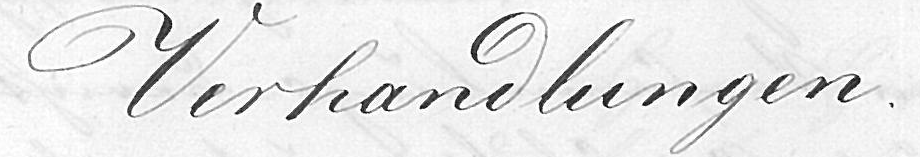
Verhandlungen
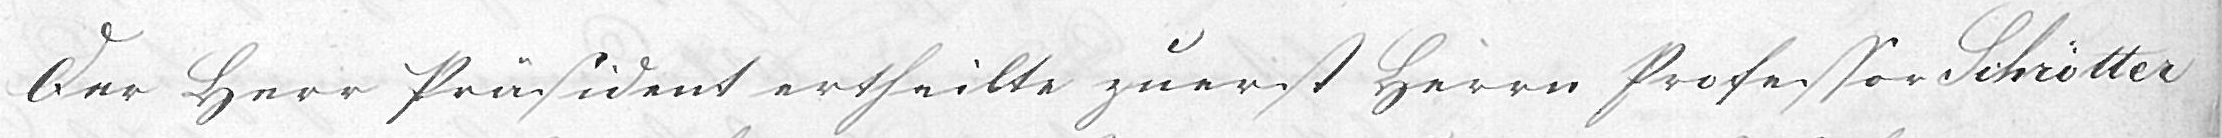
Der Herr Präsident ertheilte zuerst Herrn Professor Schrötter
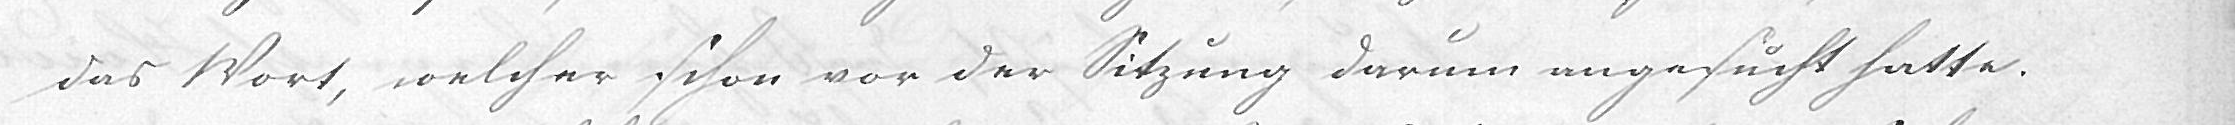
das Wort, welcher schon vor der Sitzung darum angesucht hatte.
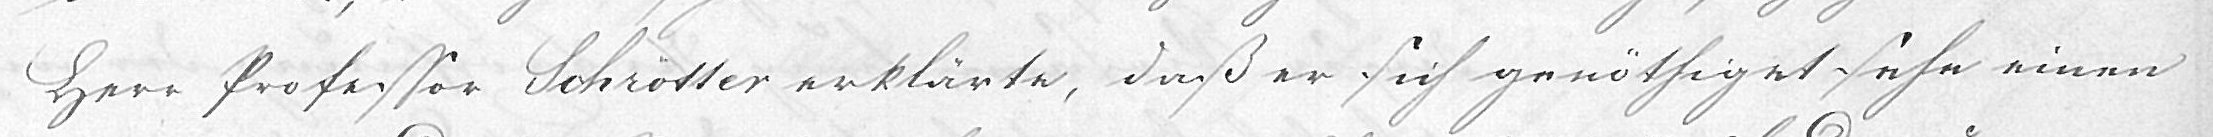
Herr Professor Schrötter erklärte, daß er sich genöthiget sehe einen
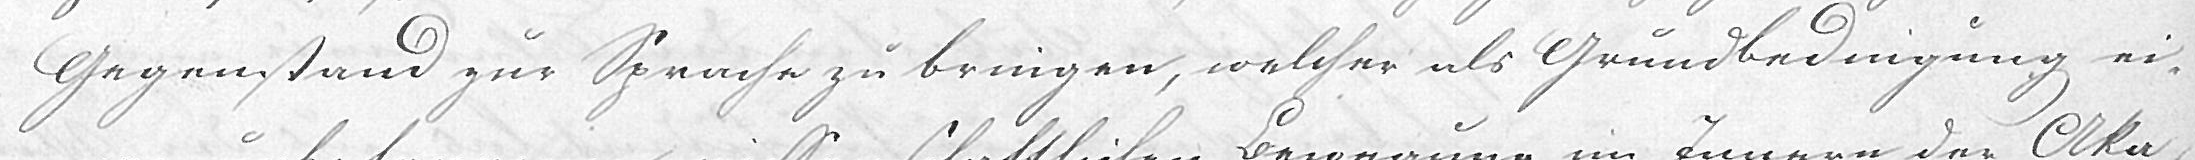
Gegenstand zur Sprache zu bringen, welcher als Grundbedingung ei-
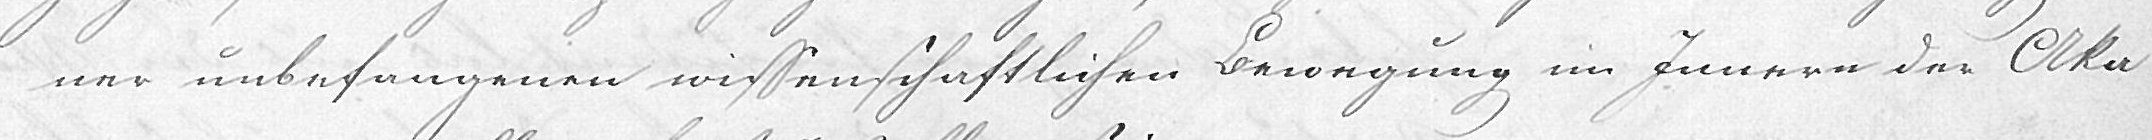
ner unbefangenen wissenschaftlichen Bewegung im Innern der Aka-
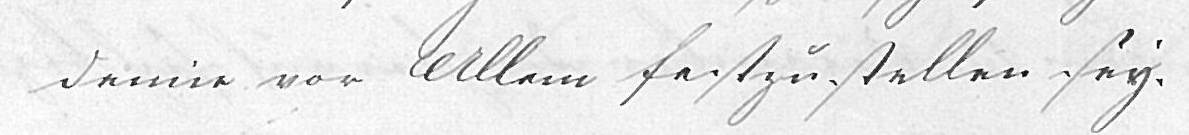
demie vor Allem festzustellen sey:
